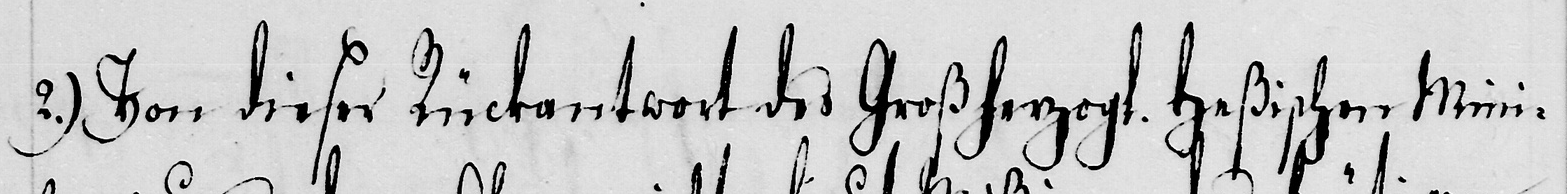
2.) Von dieser Rückantwort des Großherzogl. Heßischen Mini¬
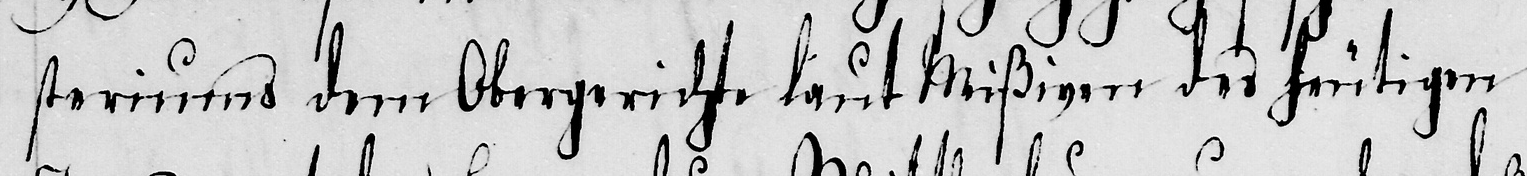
steriums dem Obergerichte laut Mißiven des heutigen
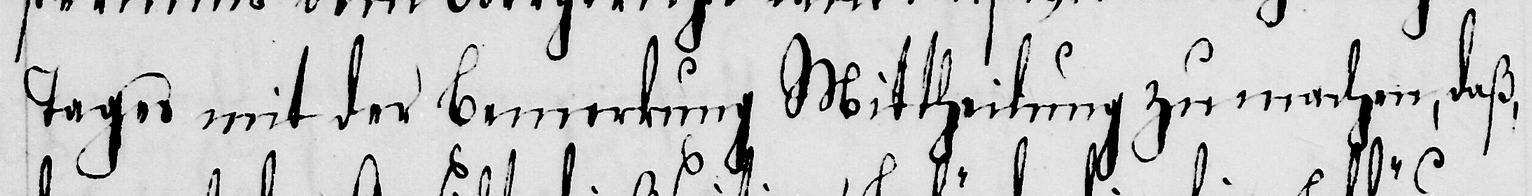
Tages mit der Bemerkung Mittheilung zu machen, daß,
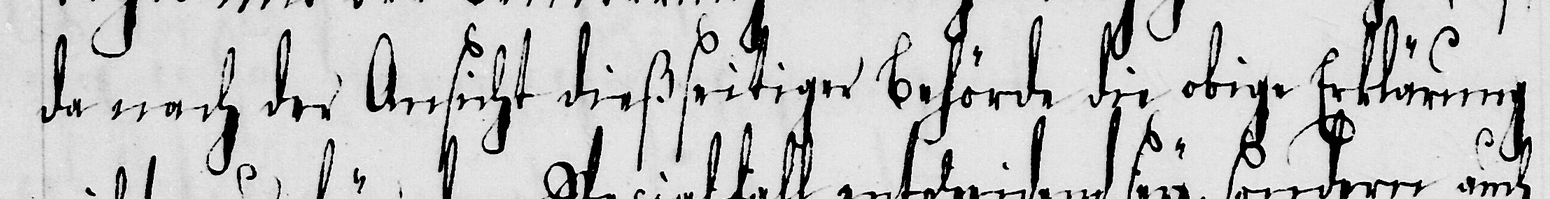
da nach der Ansicht dießseitiger Behörde die obige Erklärung
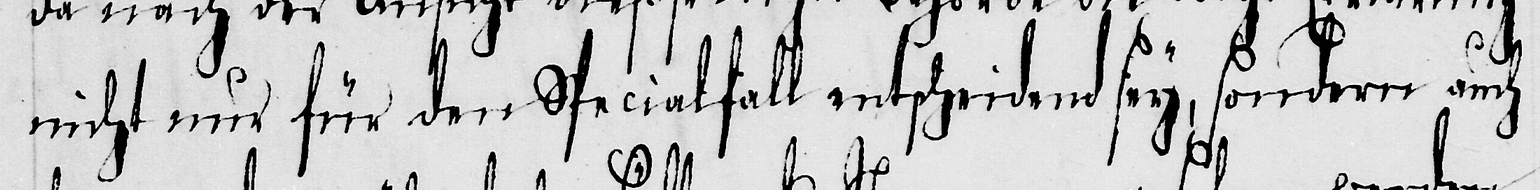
nicht nur für den Specialfall entscheidend sey, sondern auch
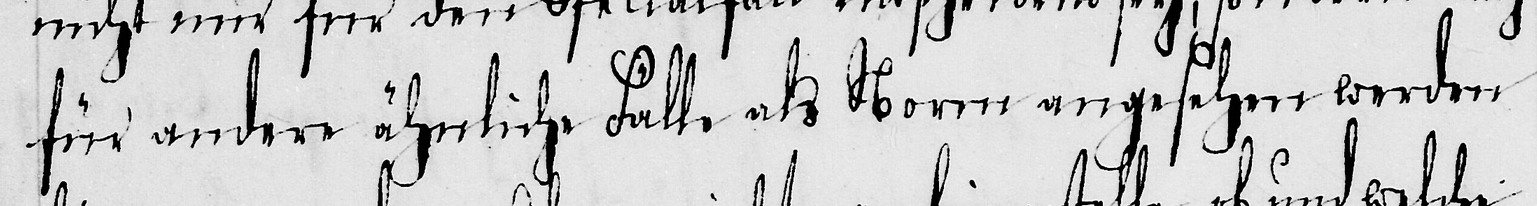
für andere ähnliche Fälle als Norm angesehen werden
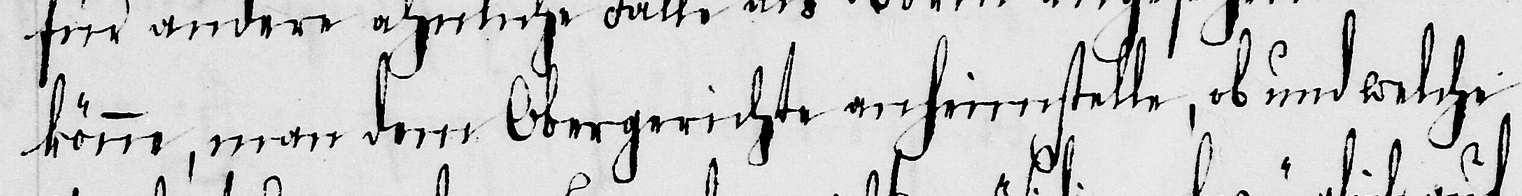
könne, man dem Obergerichte anheimstelle, ob und welche
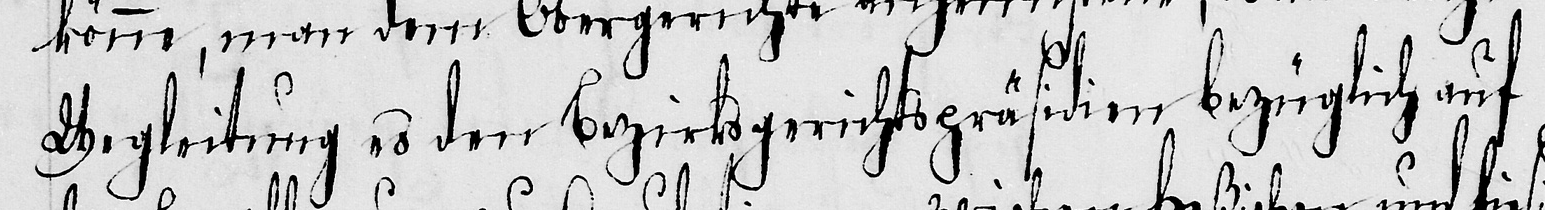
Wegleitung es den Bezirksgerichtspräsidien bezüglich auf
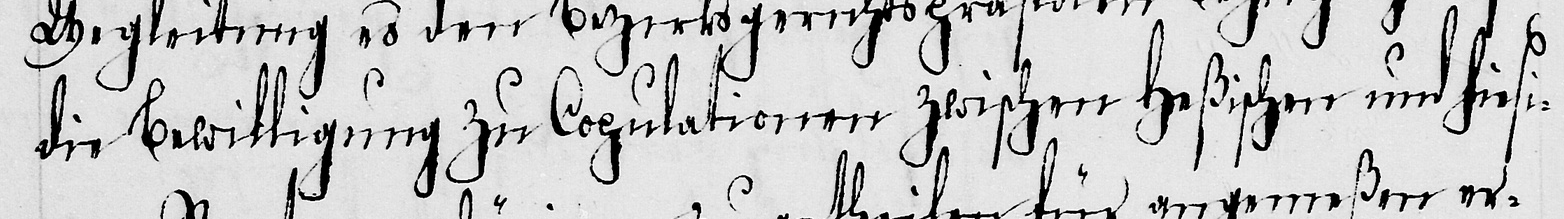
die Bewilligung zu Copulation zwischen Heßischen und hies¬
